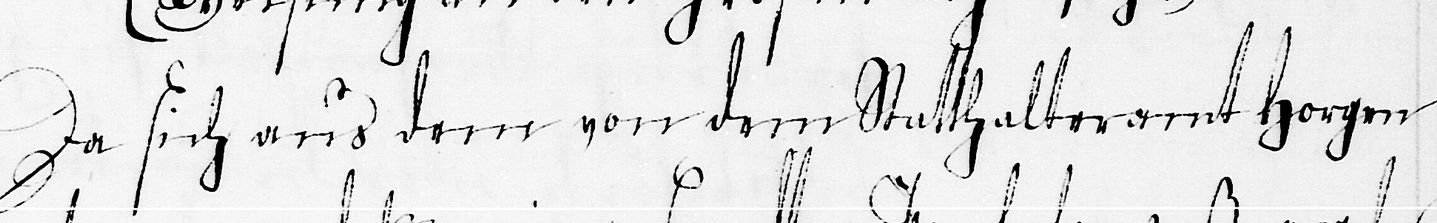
Da sich aus dem von dem Statthalteramt Horgen
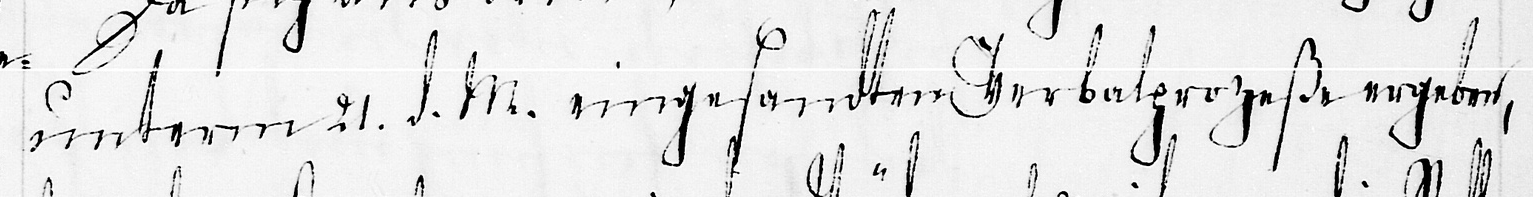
unterm 21. d. M. eingesandten Verbalprozeße ergeben,
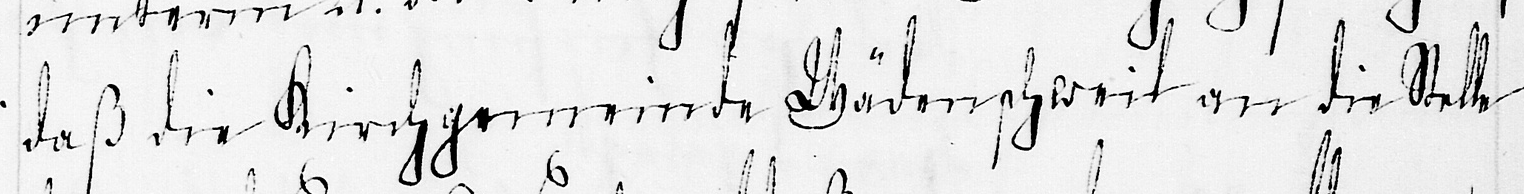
daß die Kirchgemeinde Wädenschweil an die Stelle
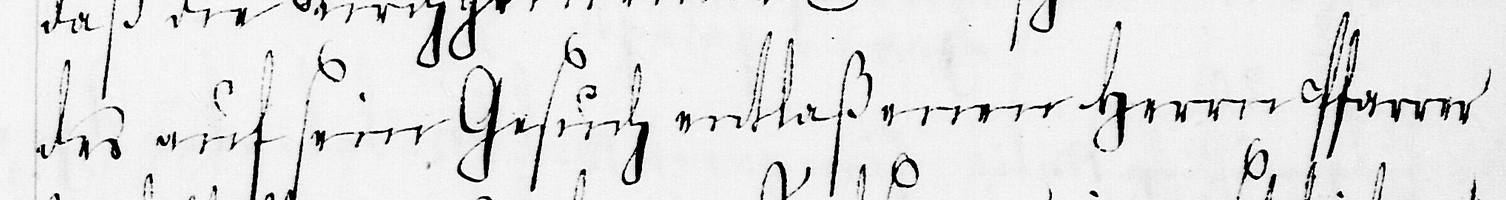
des auf sein Gesuch entlaßenen Herrn Pfarrer
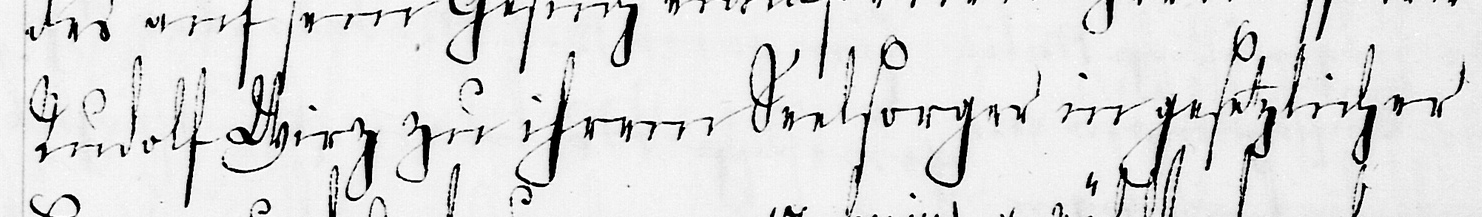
Rudolf Wirz zu ihrem Seelsorger in gesetzlicher
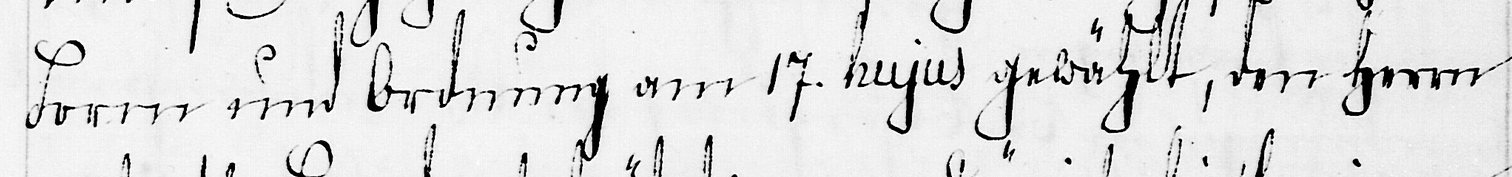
Form und Ordnung am 17. hujus gewählt, den Herrn
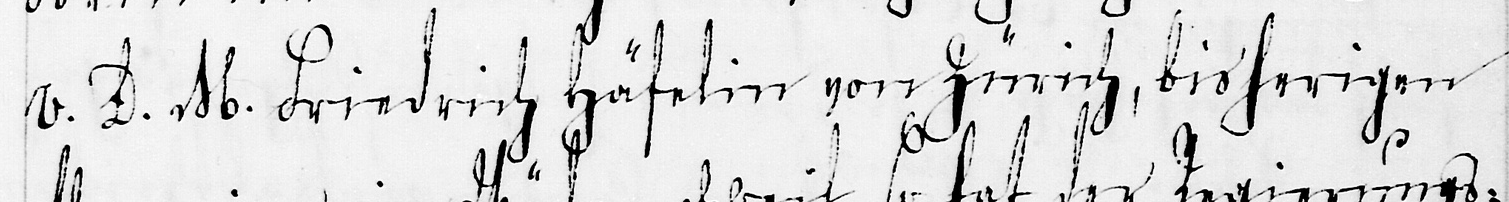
V. D. M. Friedrich Häfelin von Zürich, bisherigen
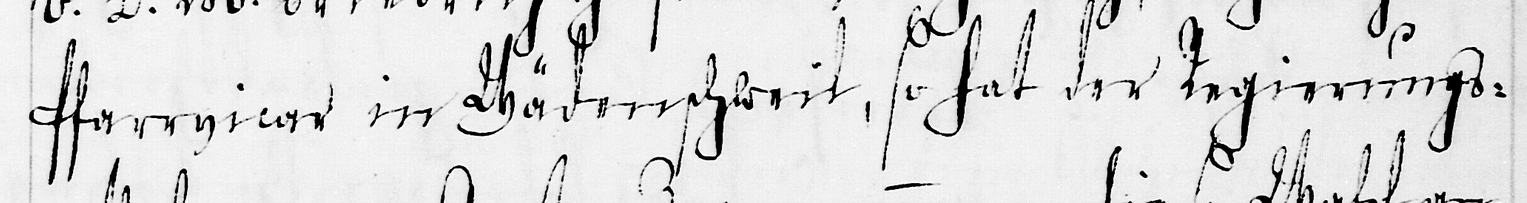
Pfarrvicar in Wädenschweil, so hat der Regierungs¬
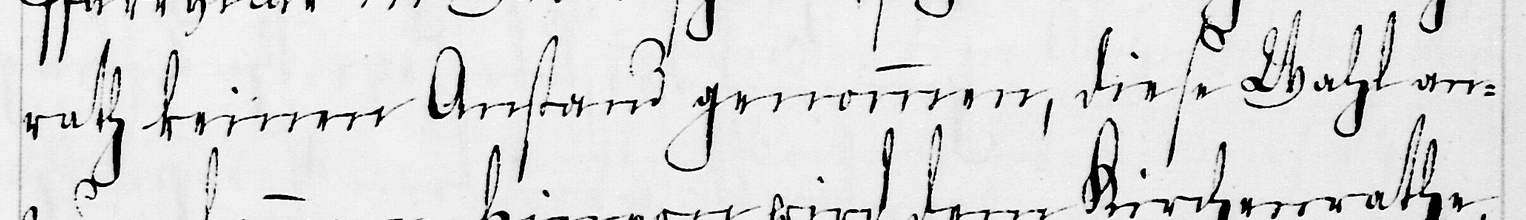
rath keinen Anstand genommen, diese Wahl an¬
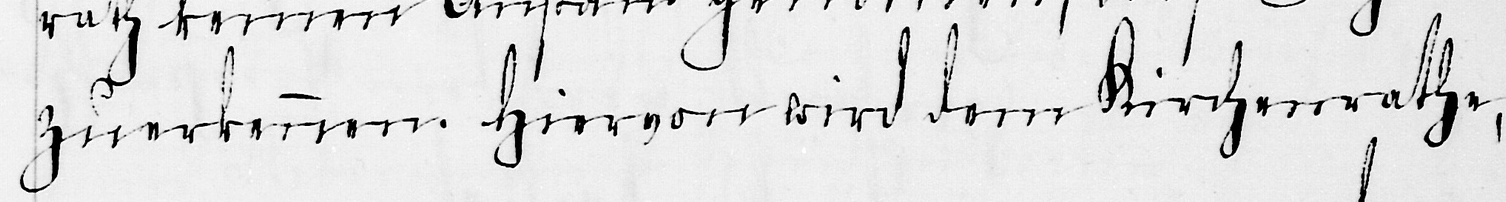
zuerkennen. Hiervon wird dem Kirchenrathe,
